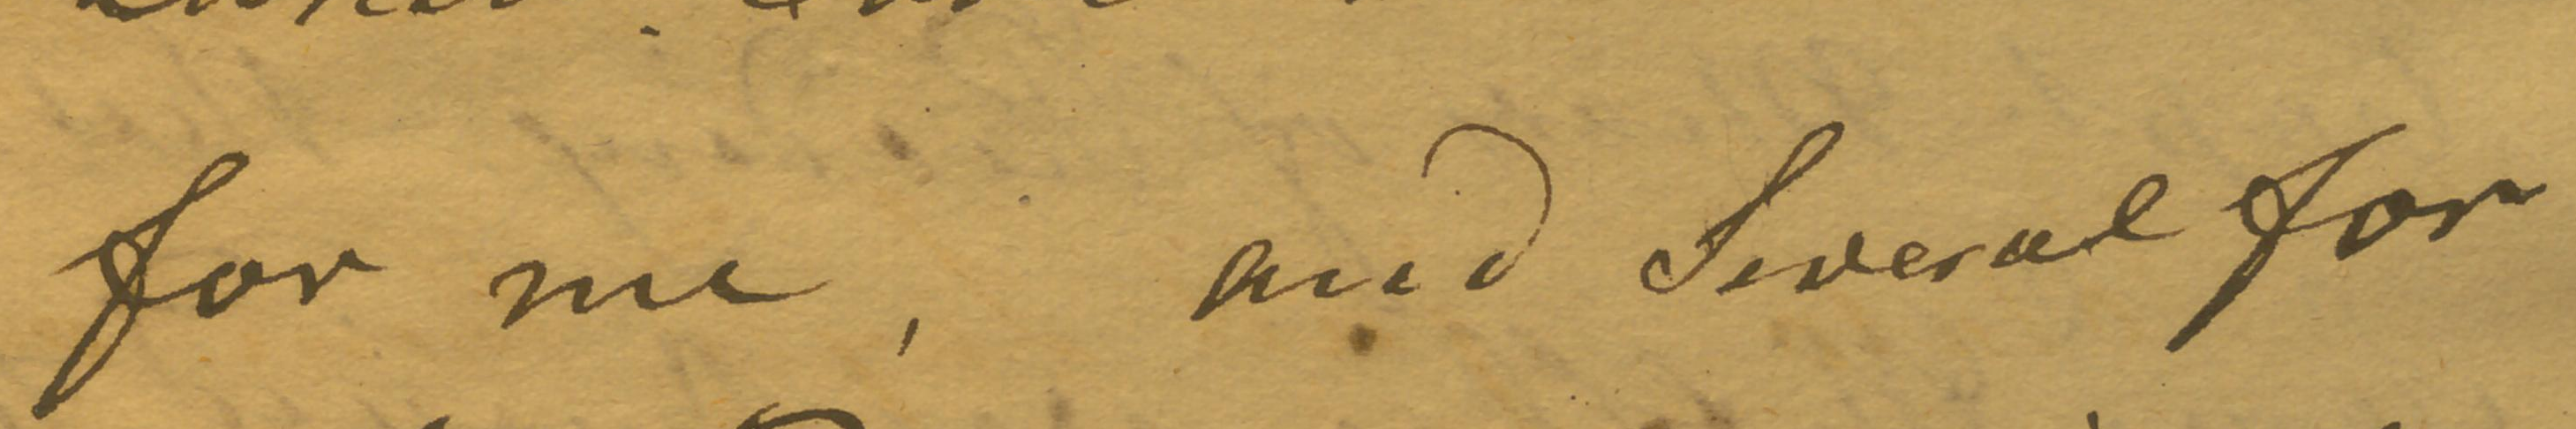for me, and Several for
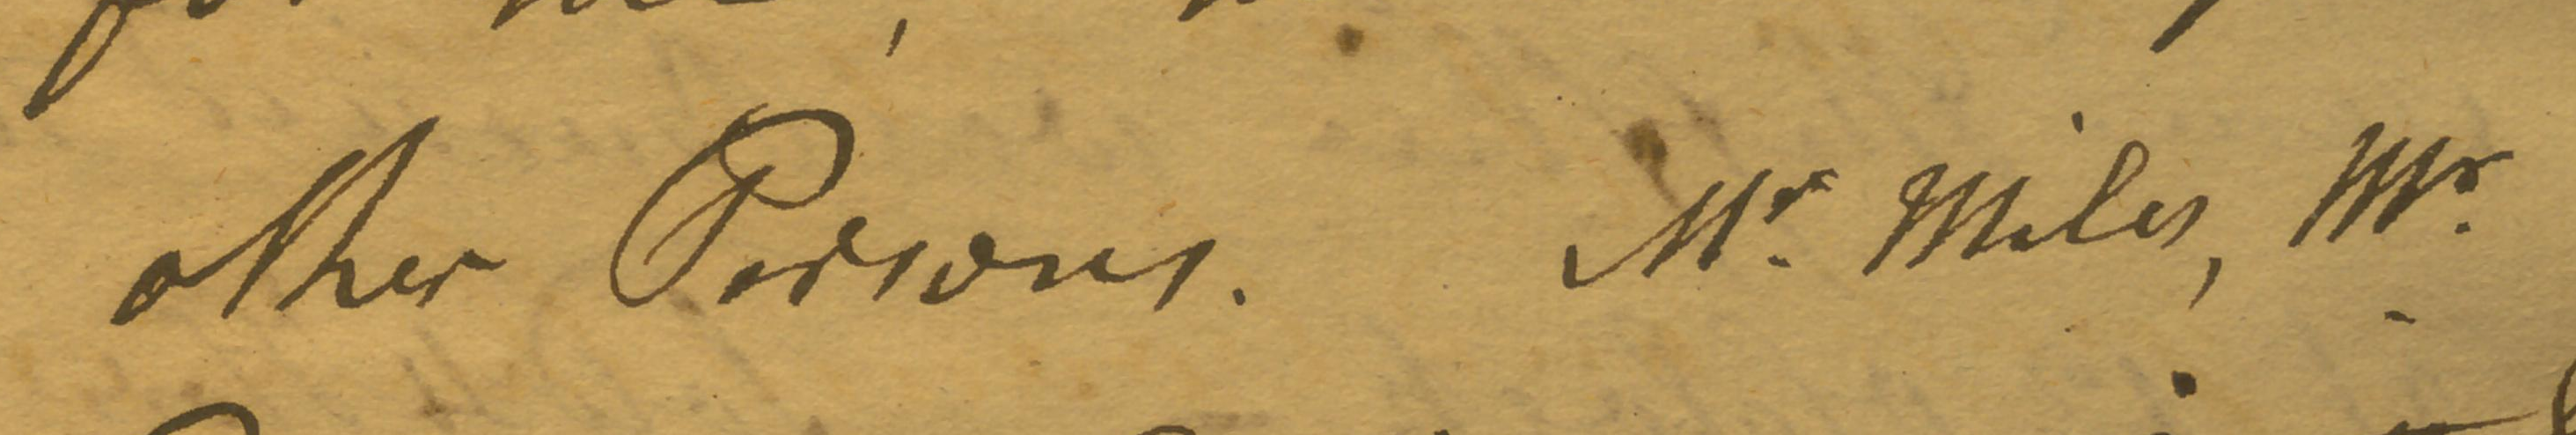other Persons, M^r. Miles M^r.
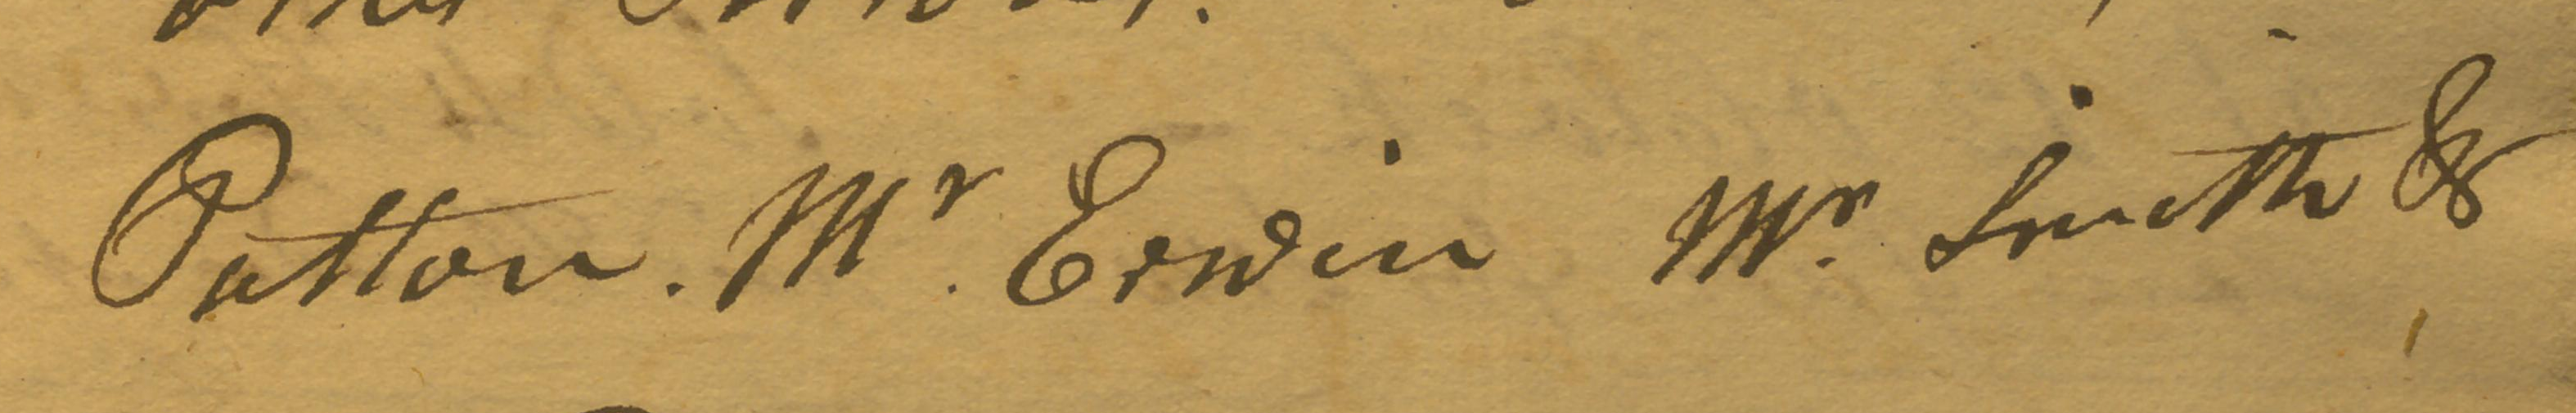Patton. M^r. Erwin M^r. Smith &
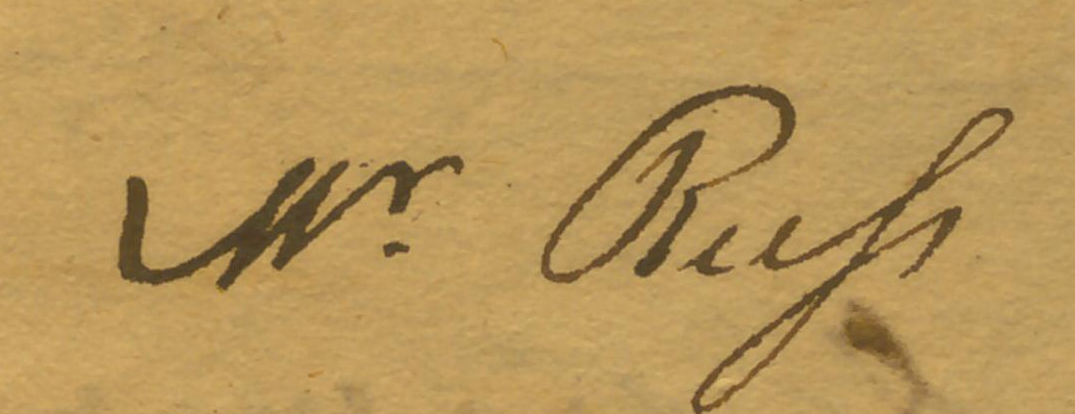M^r. Reess
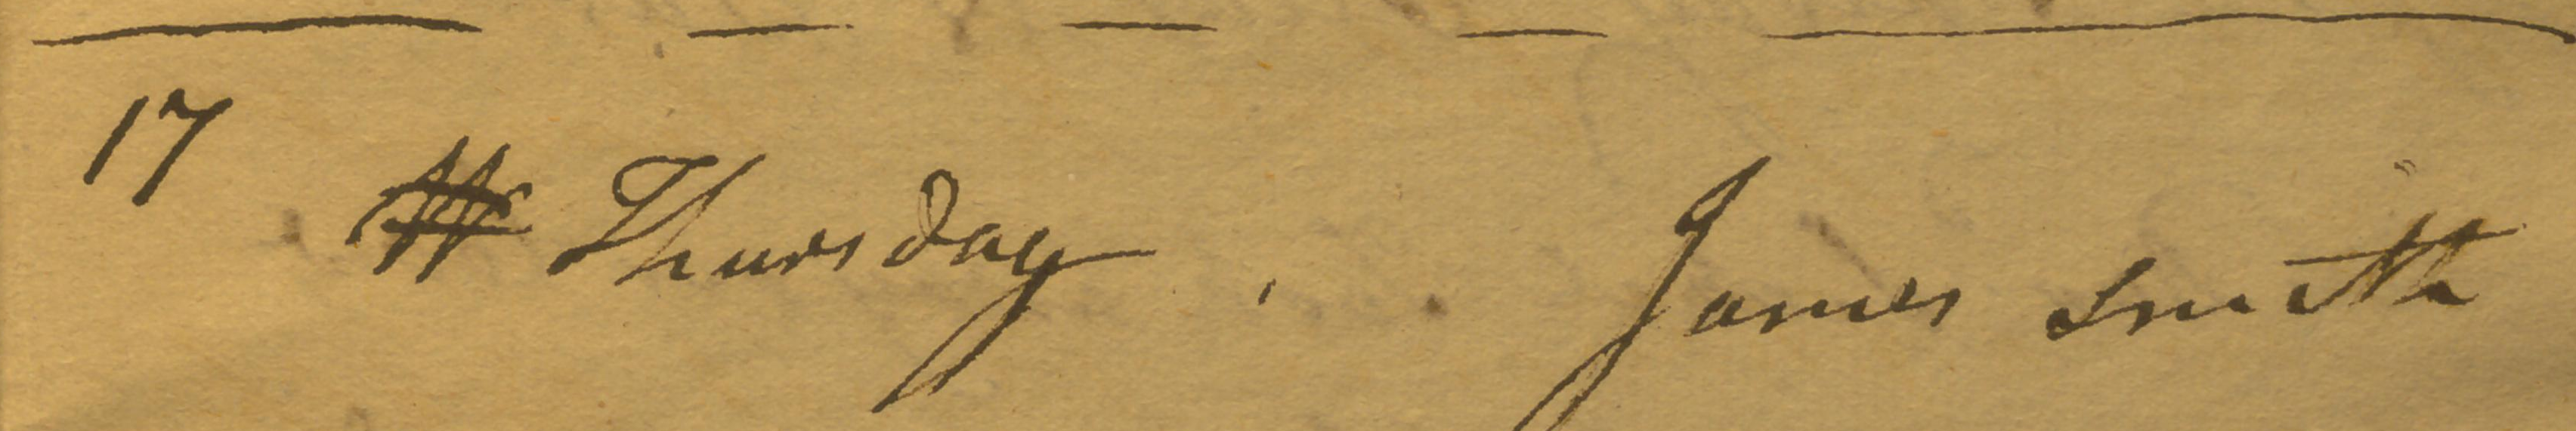17 [W] Thursday, James smith
